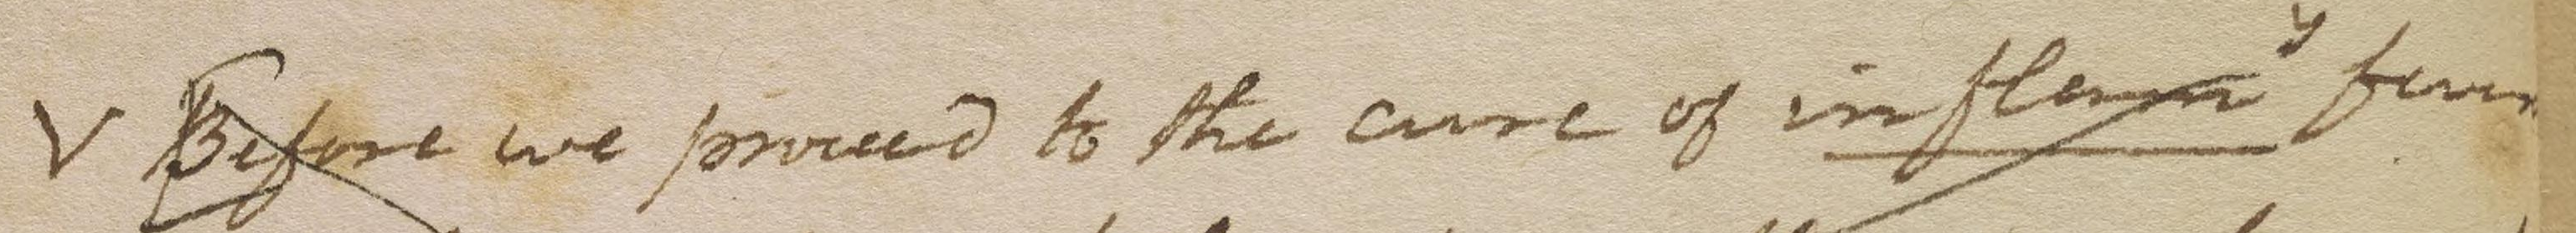Before we proceed to the cure of inflam^y fever
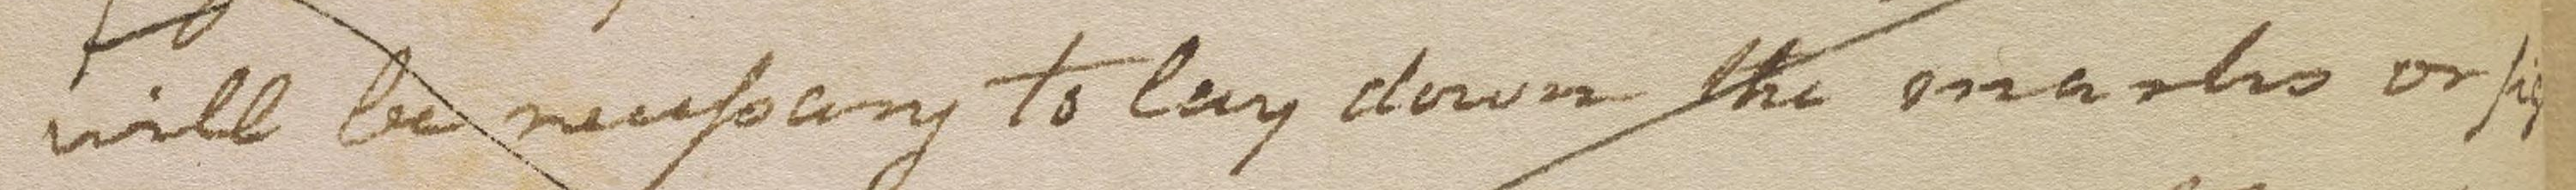will be necessary to lay down the marks or Sig
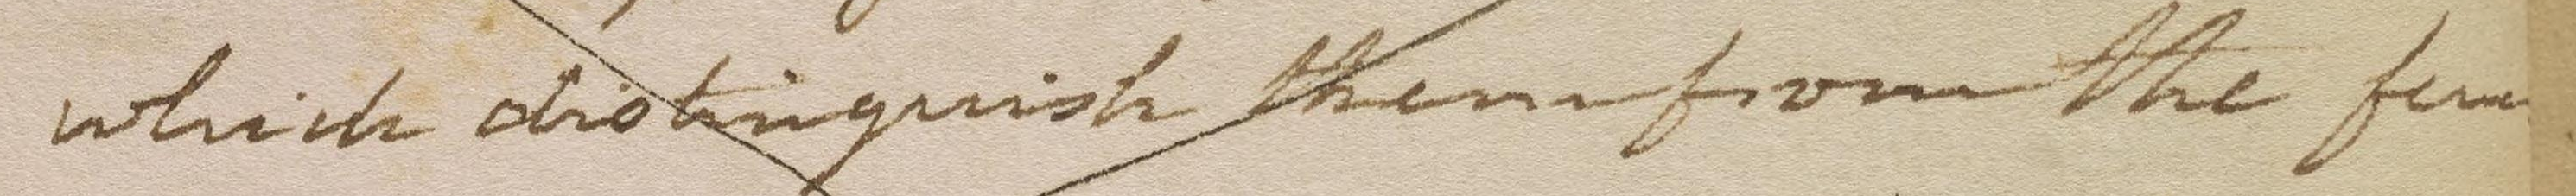which distinguish them from the fever
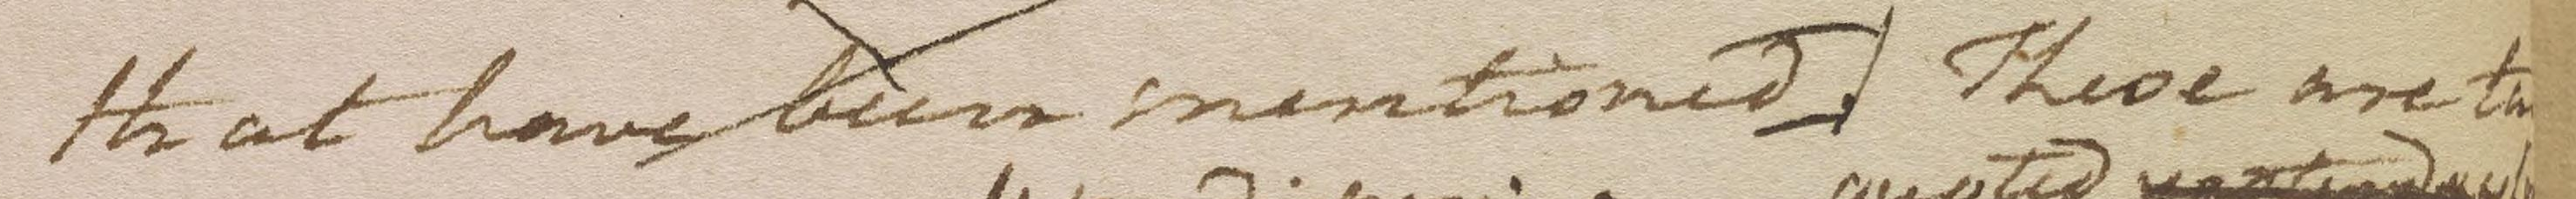that has been mentioned.) These are ta
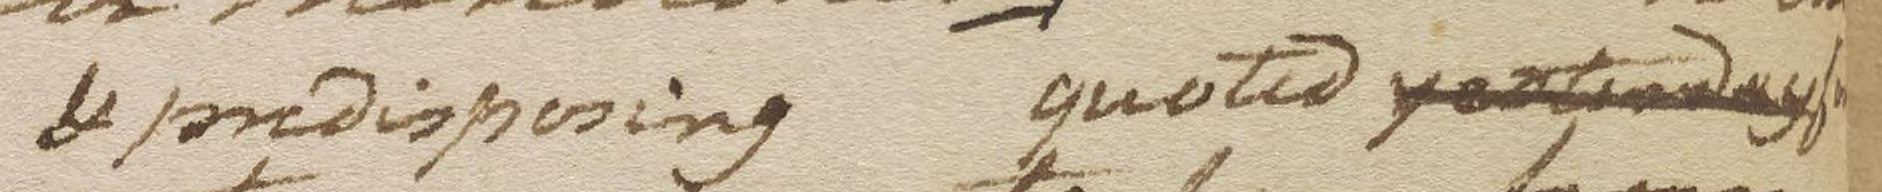& predisposing quoted [yesterday] f
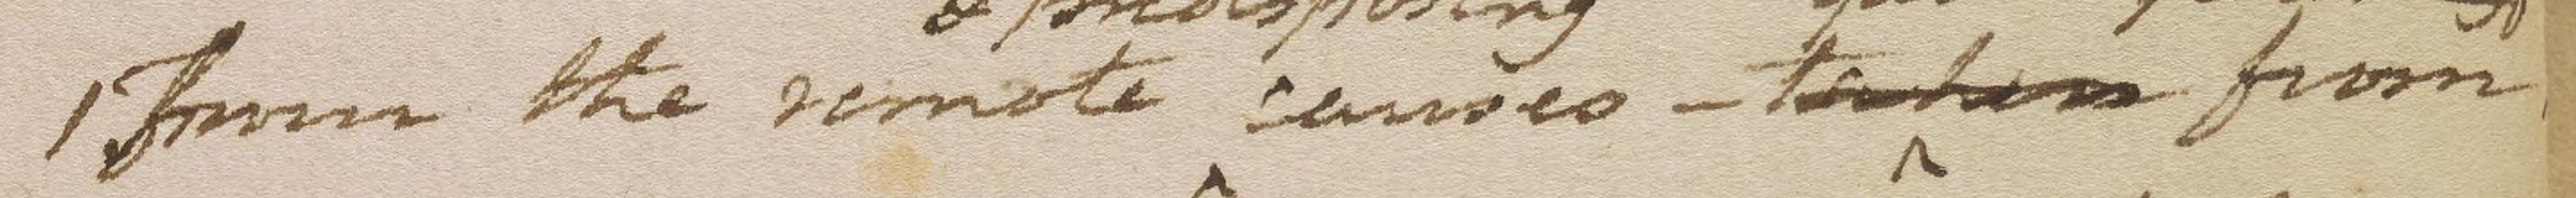From the remote ^ causes- [taken] ^ from
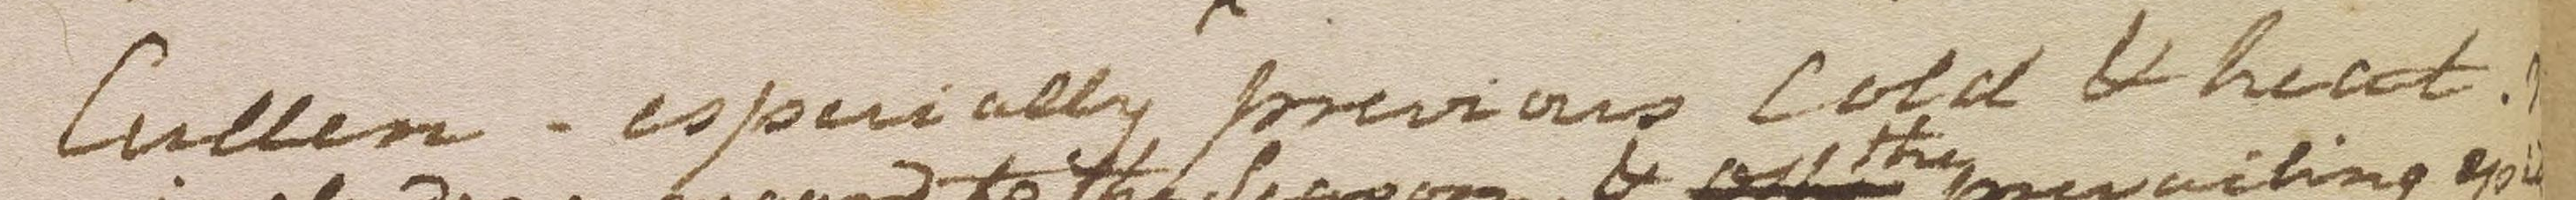Cullen, especially previous cold & heat
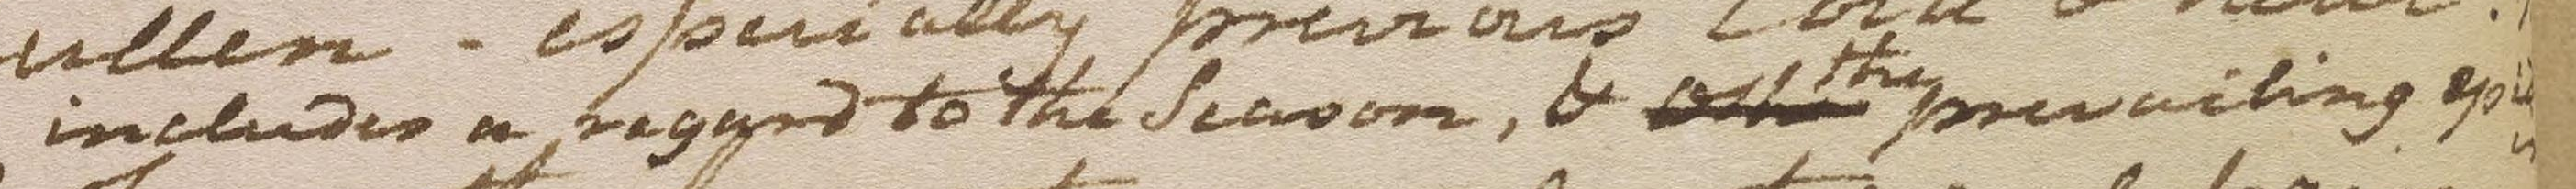includes a regard to the Season, & [other] the prevailing [__]
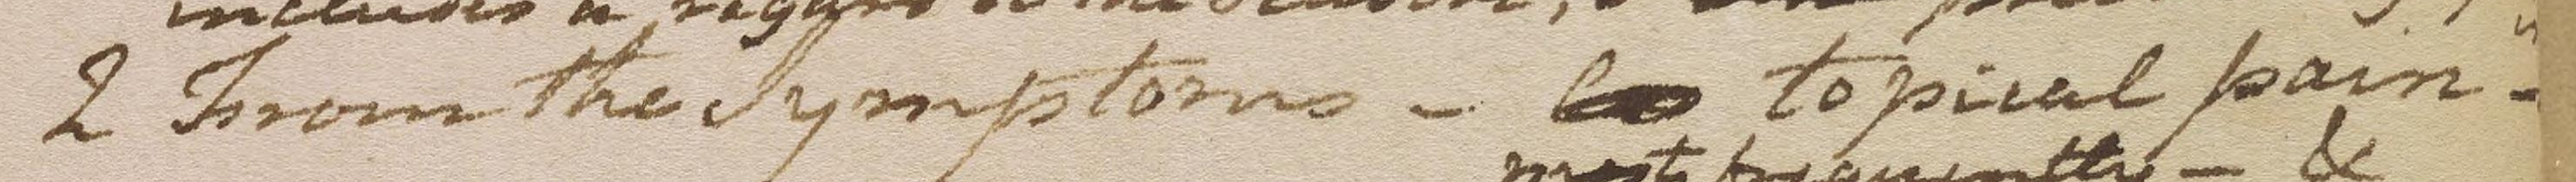2 From the Symptoms- [__] topical pain,
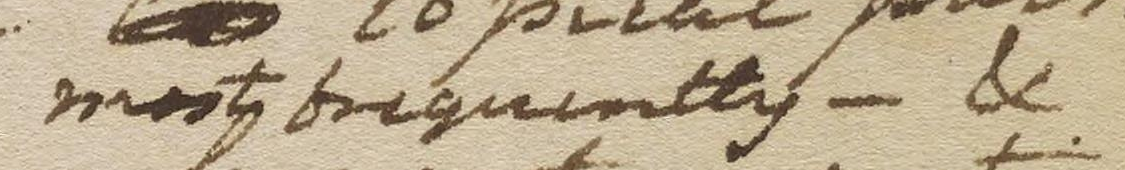most frequently- &
